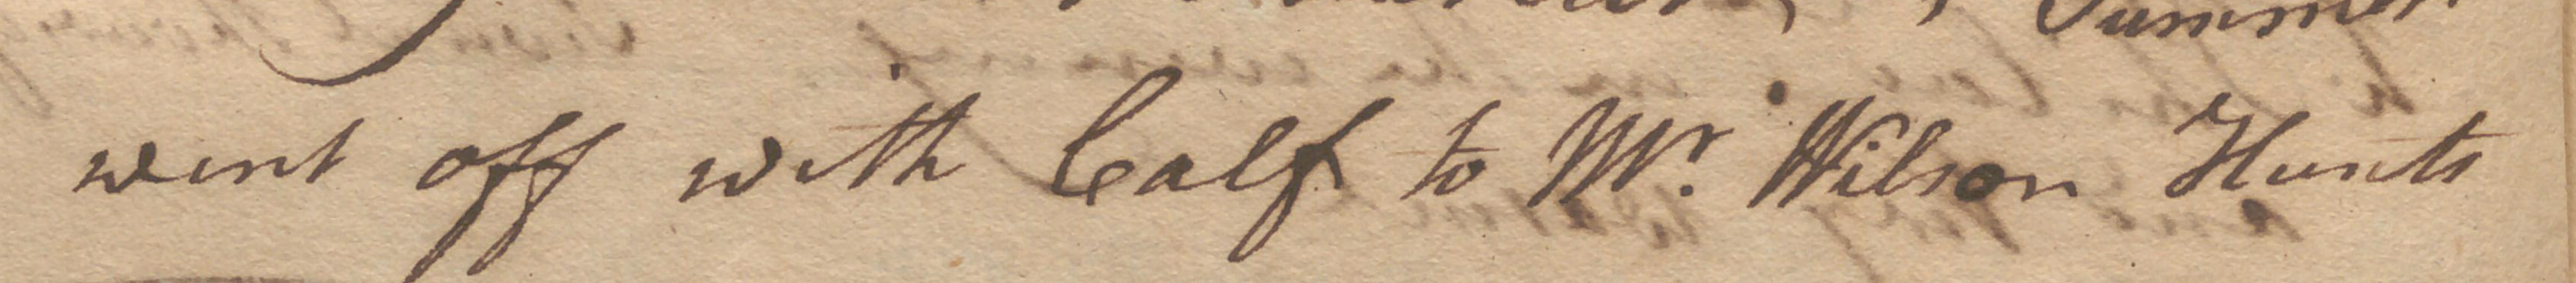went off with Calf to M^r. Wilson Hunts
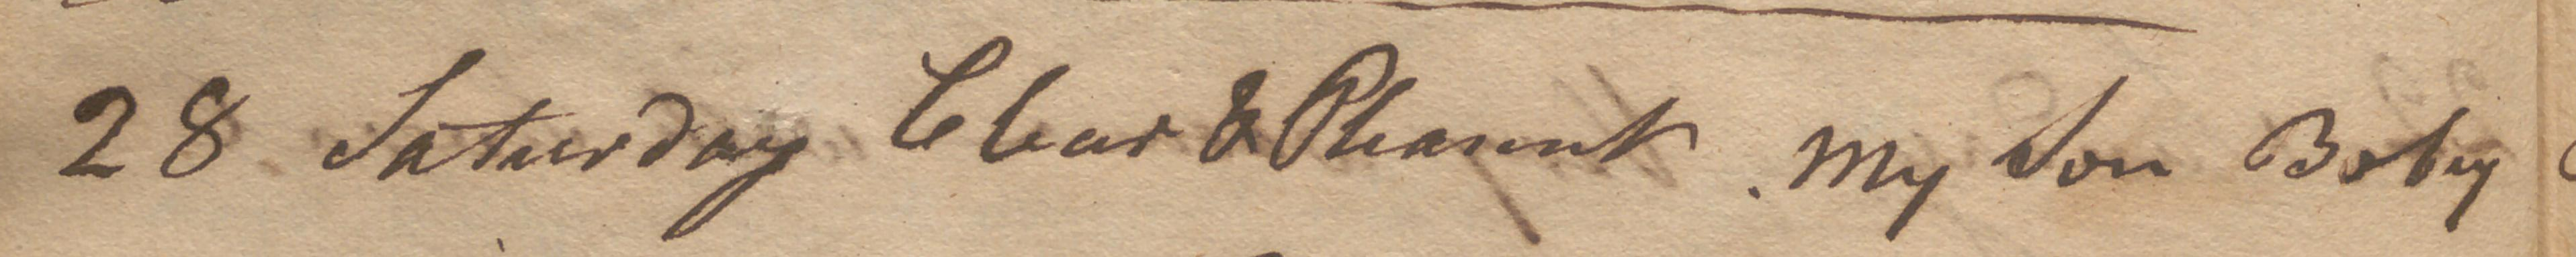28 Saturday Clear & Pleasent My Son Bobey
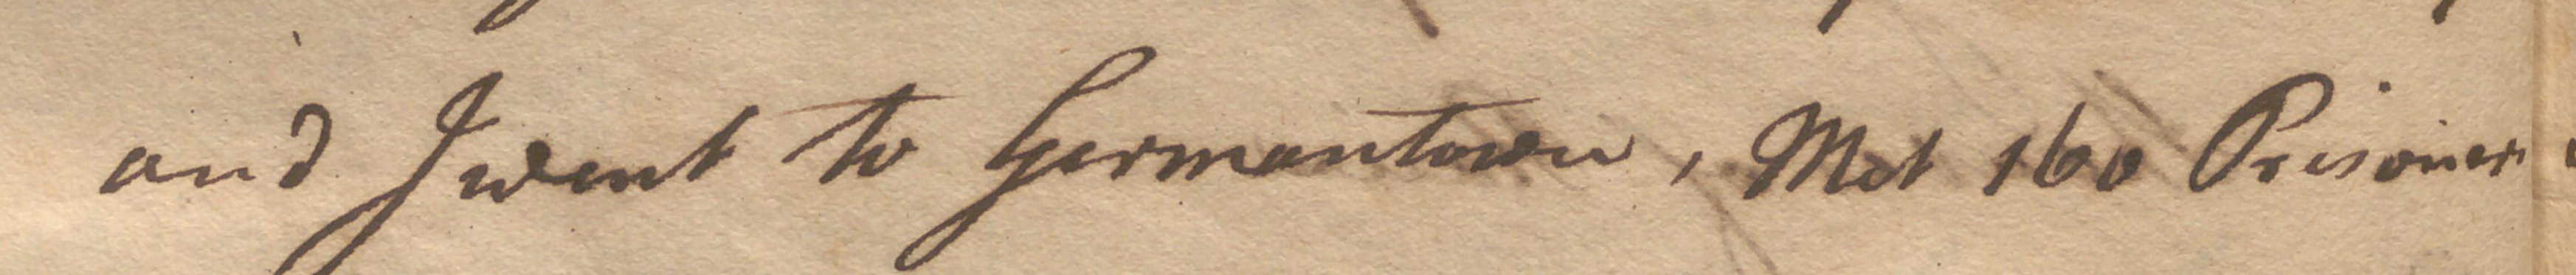and I went to Germantown, Met 160 Prisoner
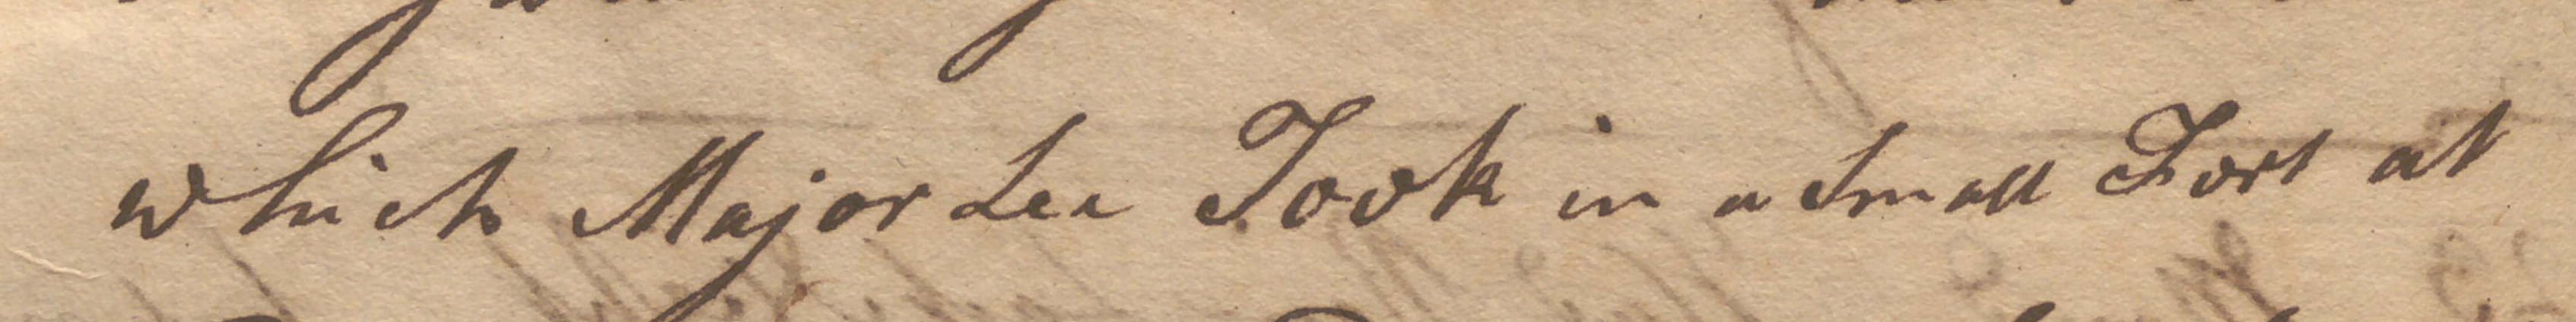which Major Lee Took in a small Fort at
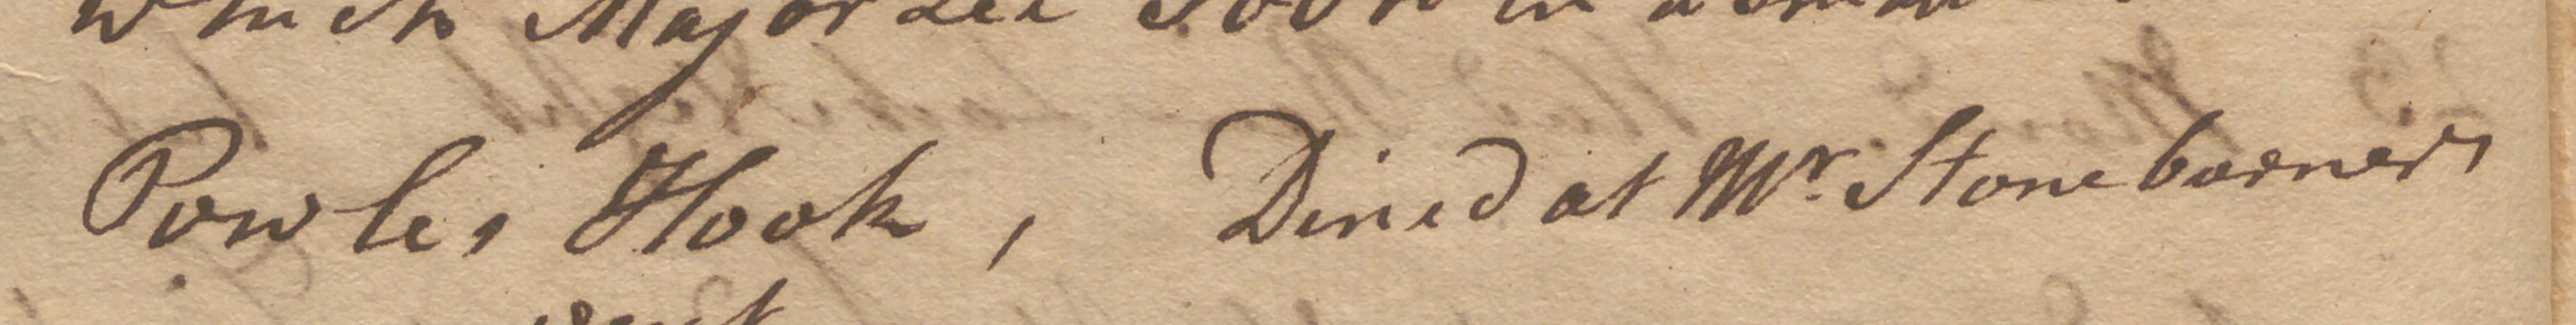Powles Hook, Dined at M^r. Stoneburners
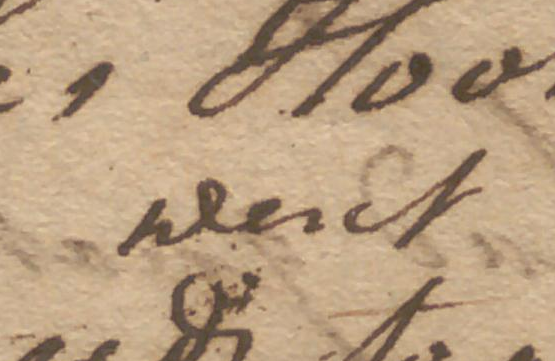went
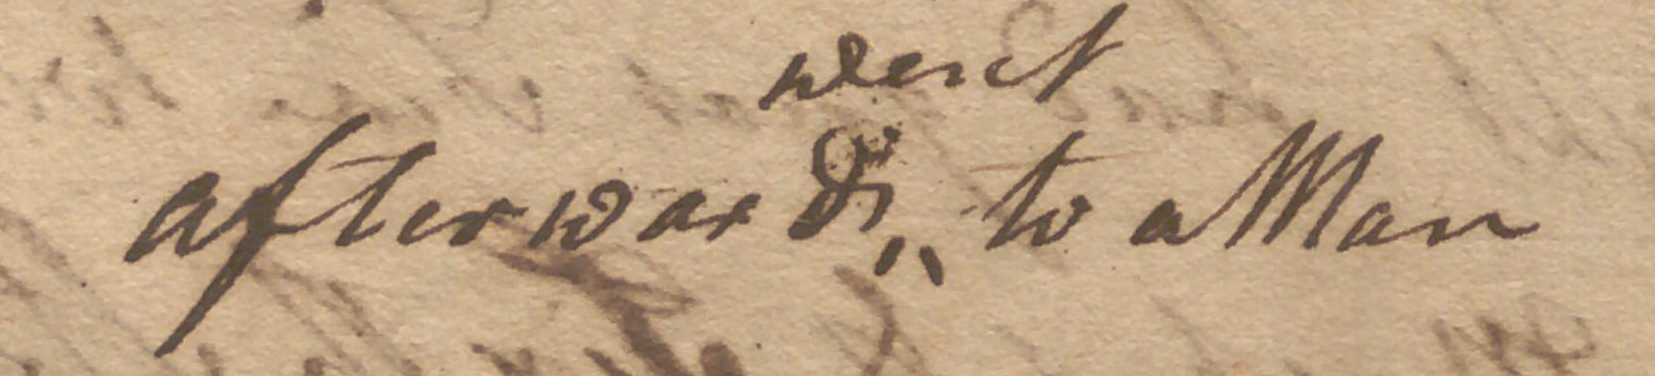afterwads, to a Man
